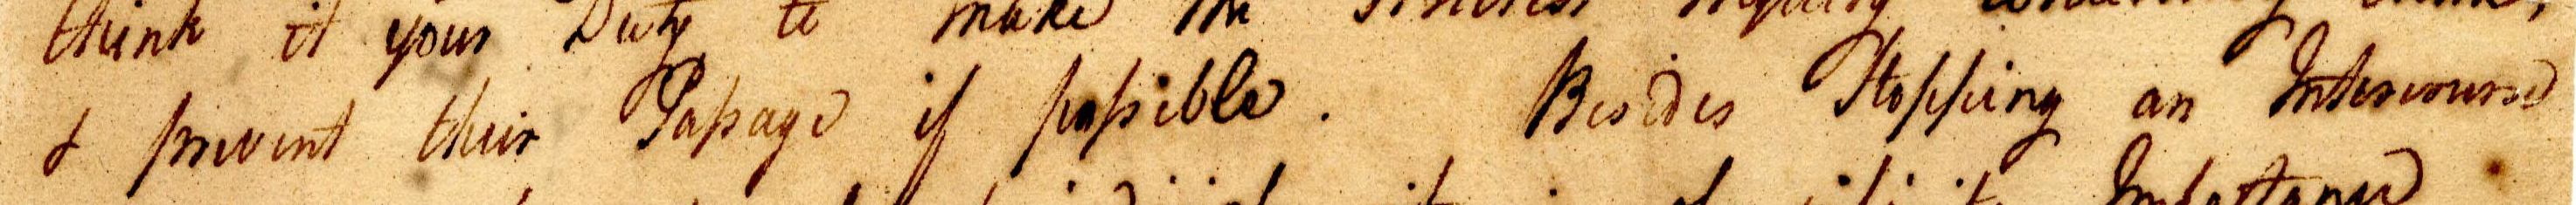& prevent their Passage if possible. Besides Stopping an Intercourse
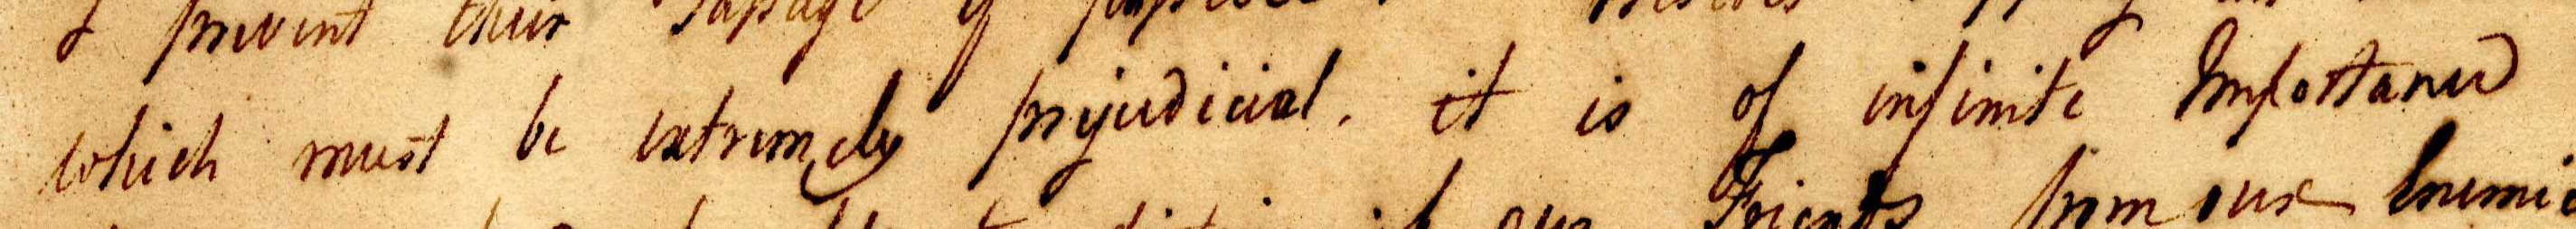which must be extremely prejudicial, it is of infinite Importance
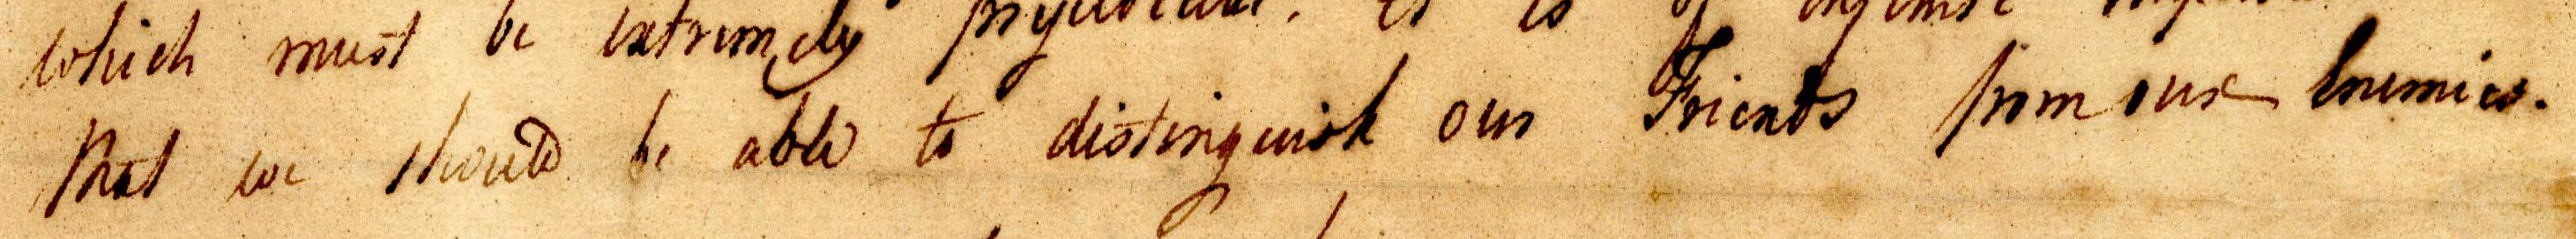that we should be able to distinguish our Friends from our Enemies.
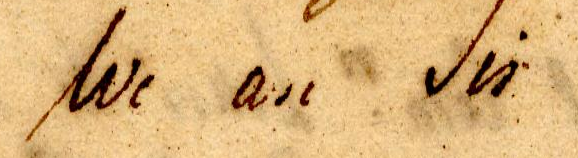We are Sir
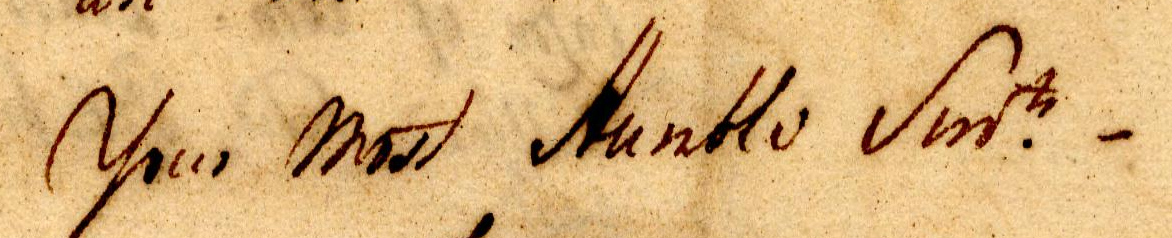Your Most Humble Serv^t.-
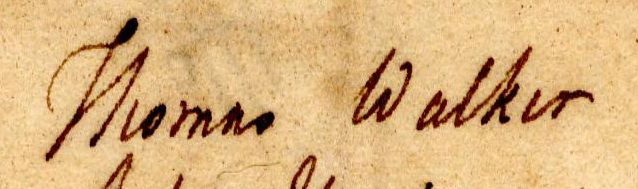Thomas Walker
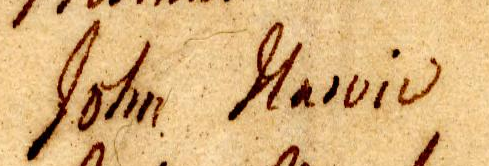John Harvie
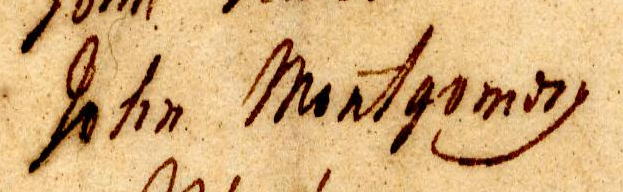John Montgomery
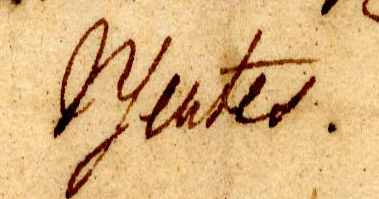J Yeates.
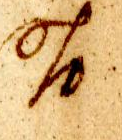To
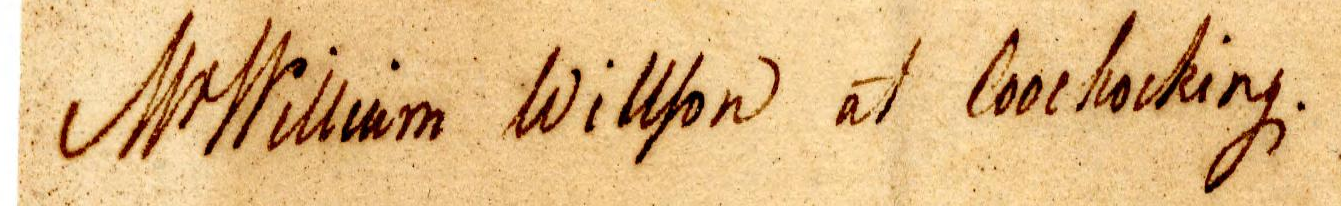M^r William Willson at Coochocking.
